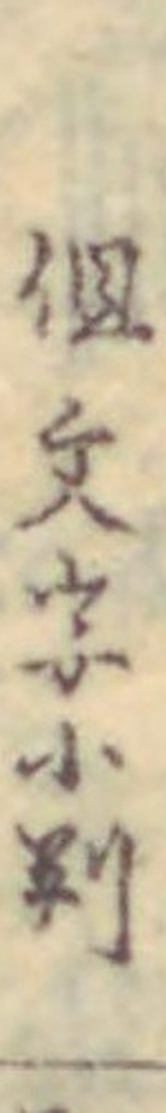但文字小判
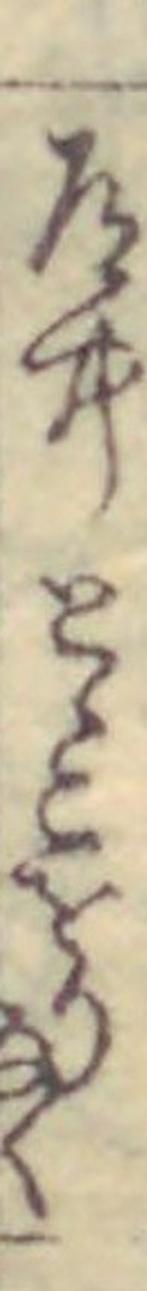道中とゝこをりなく
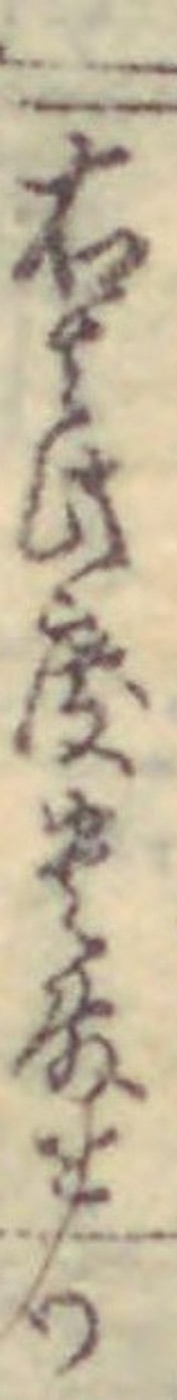右は此度貴殿を
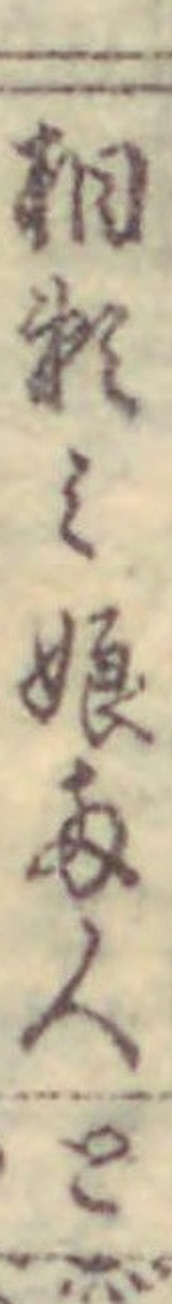相頼み娘両人
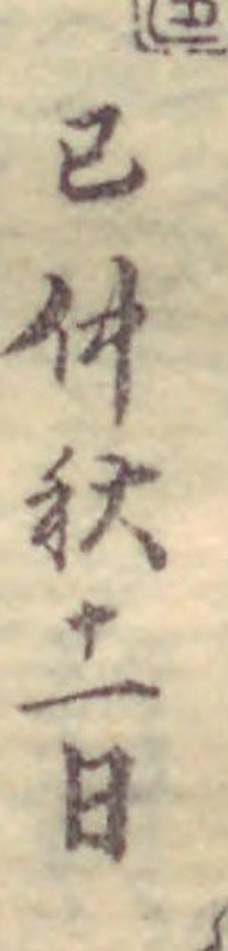巳仲秋十一日
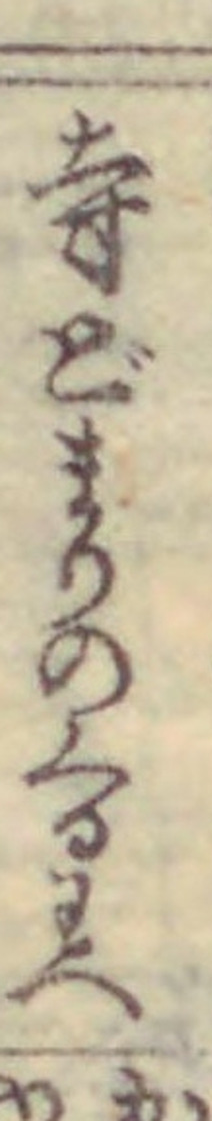寺どまりのくるわへ
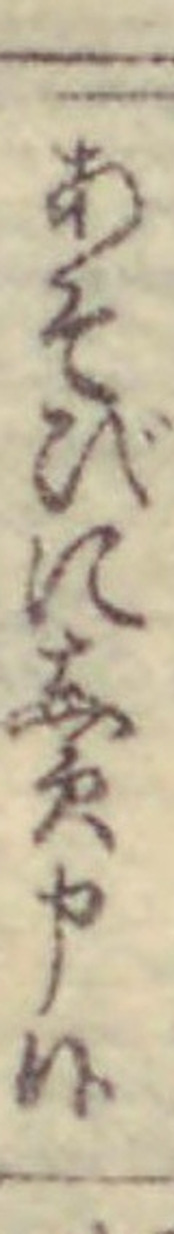あそびに売申候
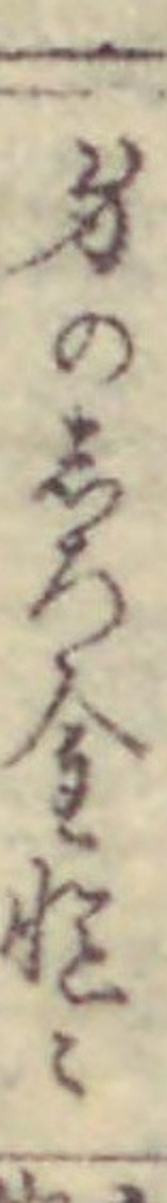身のしろ金慥に
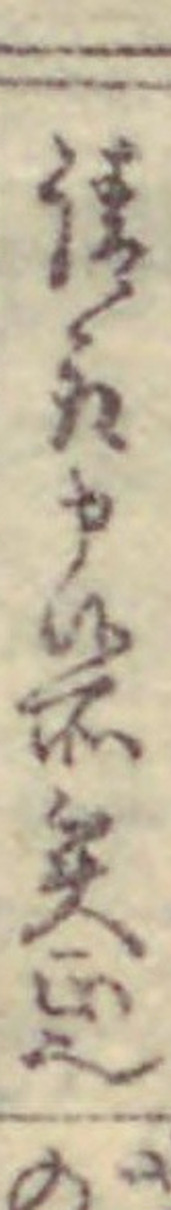請取申候所実正也
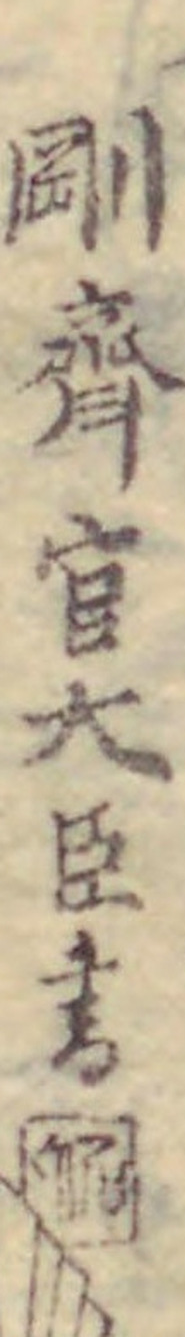剛斉官大臣書
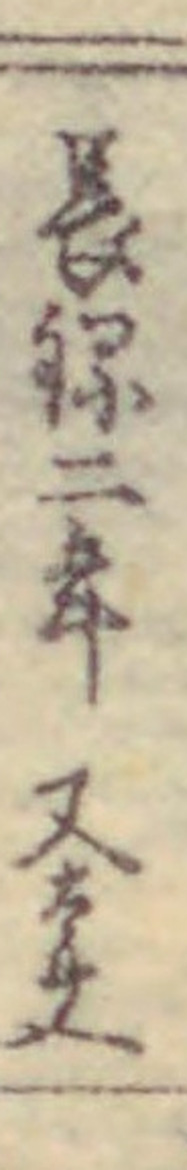長禄二年又太夫
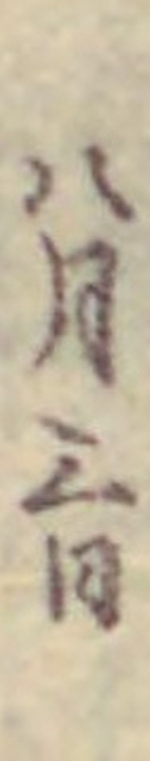八月三日
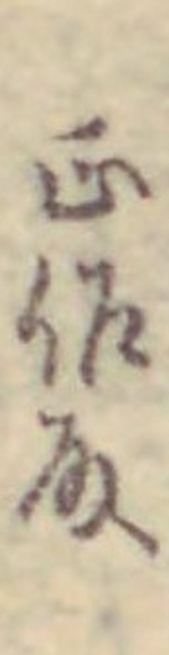正作殿
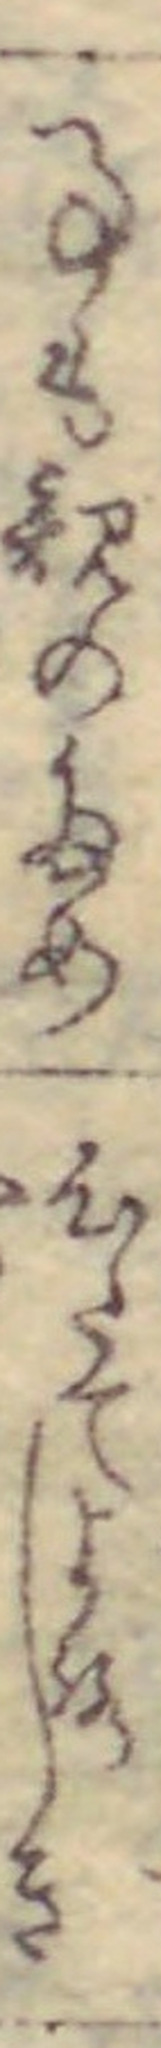事も親のため
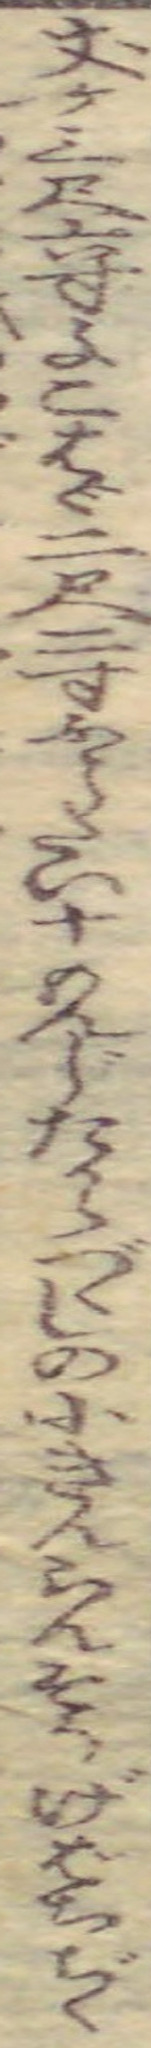丈ヶ三尺六寸よこはゞ二尺二寸ふうたい十もんじたからづくしの小きんらんそうげばちぢく
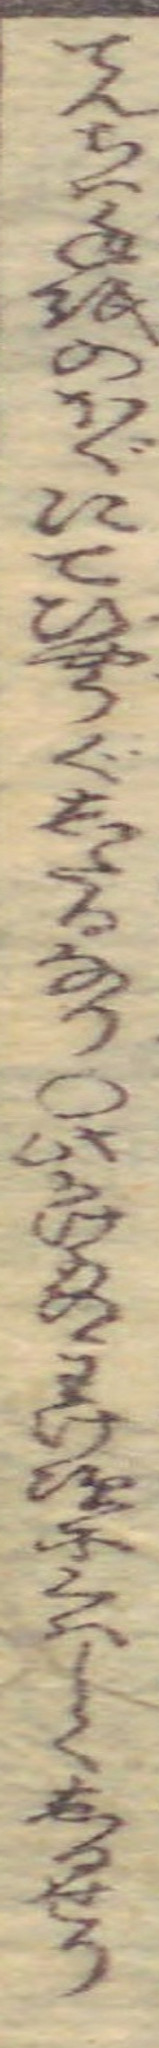てんちは手紙のほぐにてひやうぐしたるなり○此かけものゝわけ次にくはしくしるせり
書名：八ツ目鱣因縁物語 3巻
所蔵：国立国会図書館 National Diet Library, JAPAN
